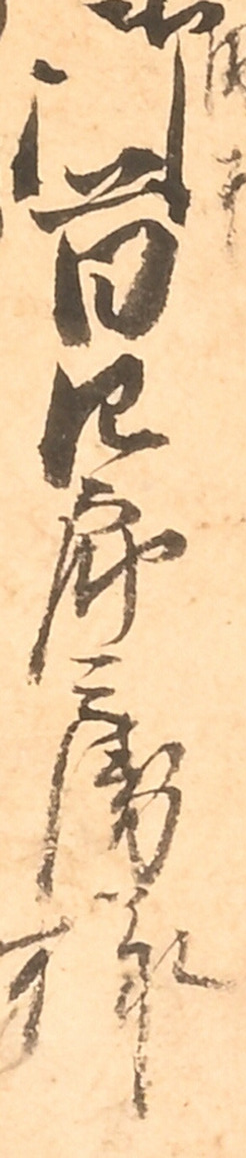御首四郎兵衛様
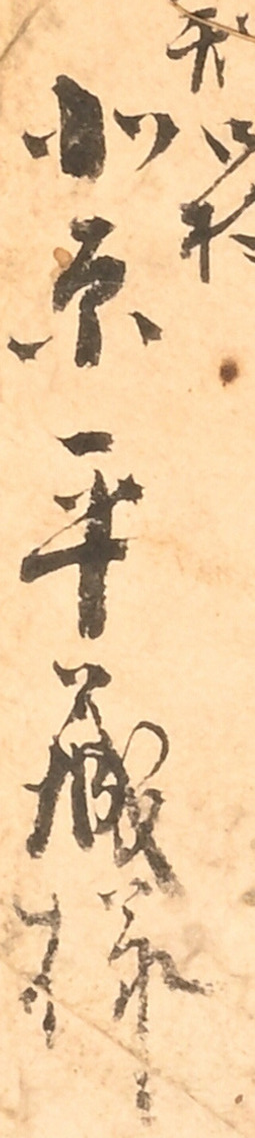北原平蔵様

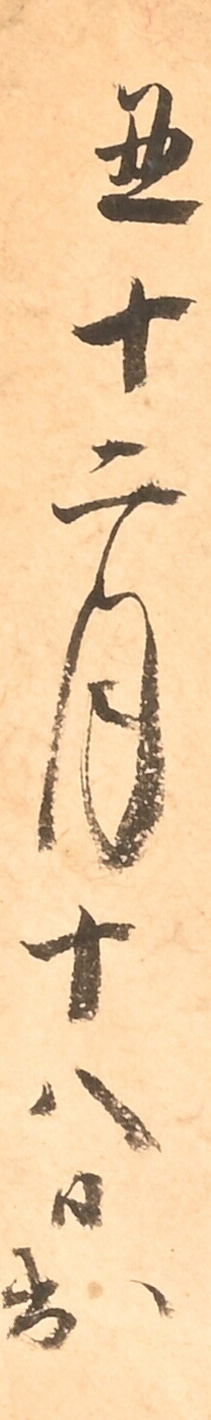丑十二月十八日出
